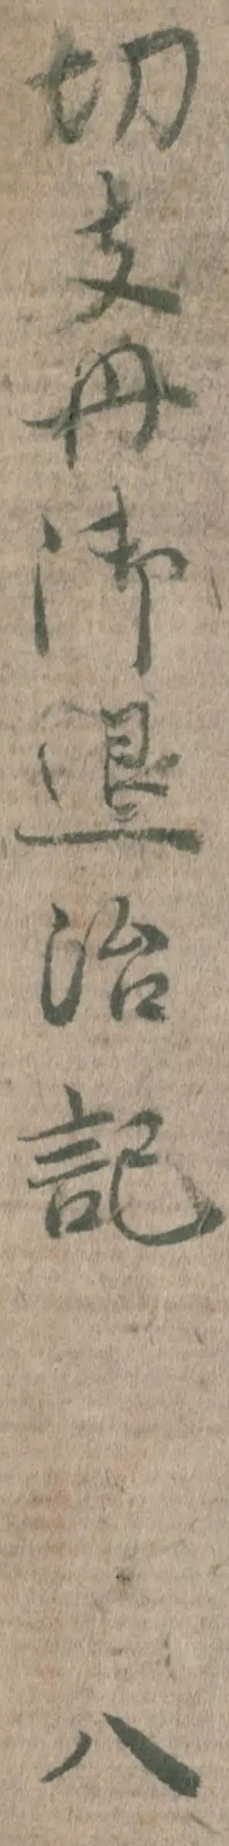切支丹御退治記八

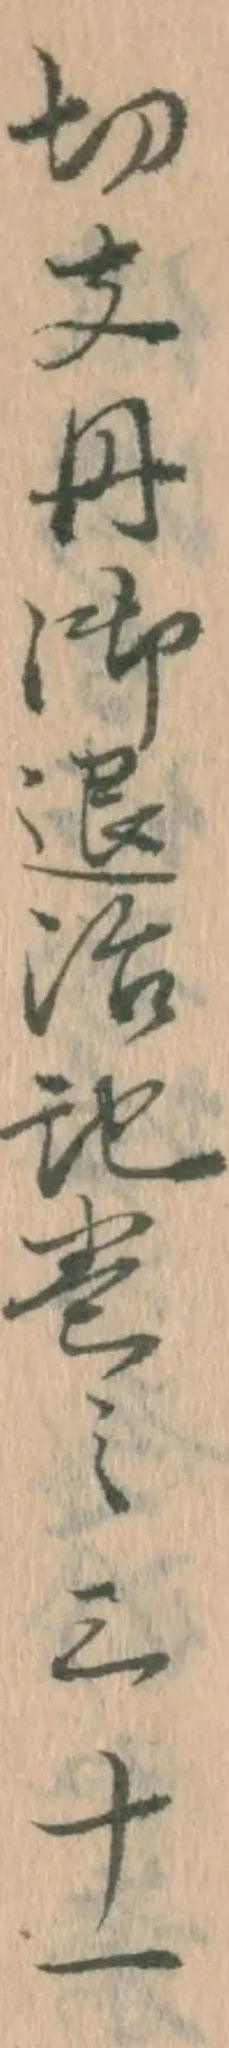切支丹御退治記巻之三十一
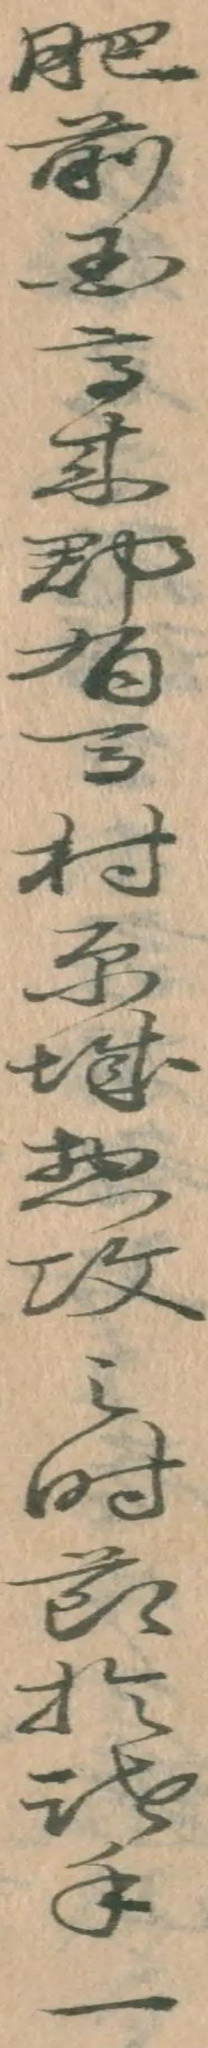肥前国高来軍有馬村原城惣攻之時節於諸手一
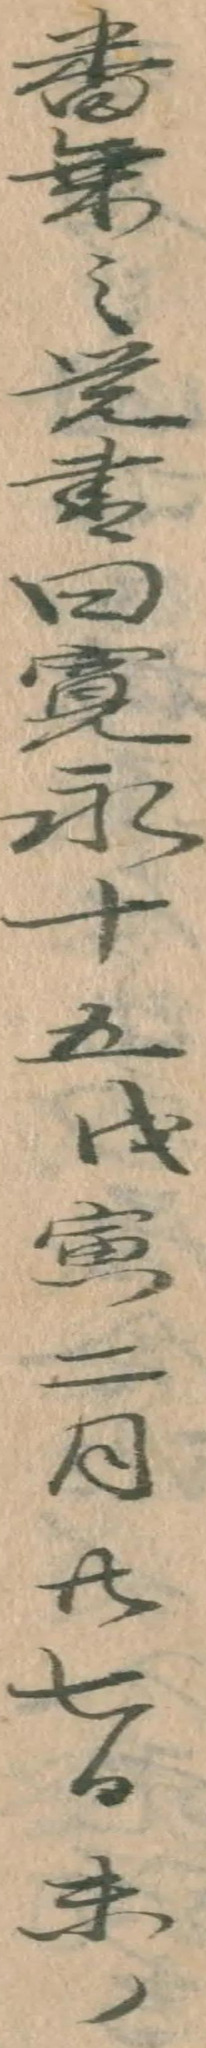番乗之覚書曰寛永十五戌寅二月廿七日未之
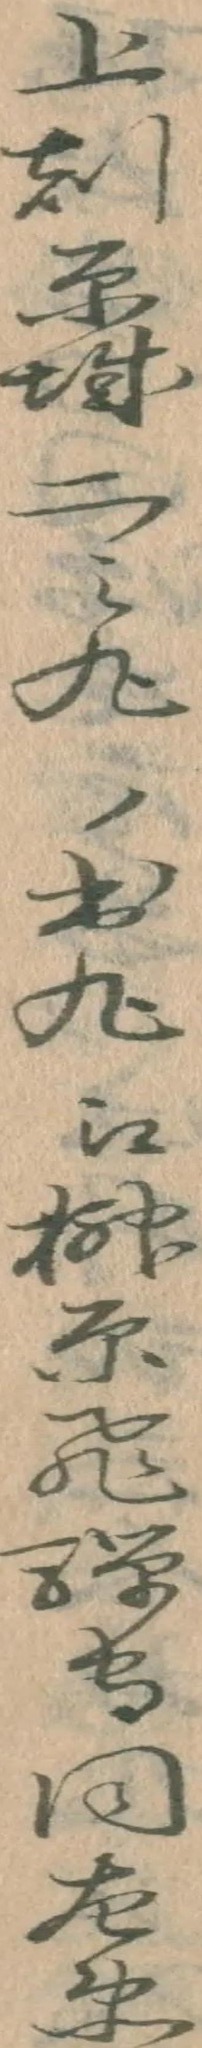上刻原城二之丸之出丸江榊原飛騨守同左衛
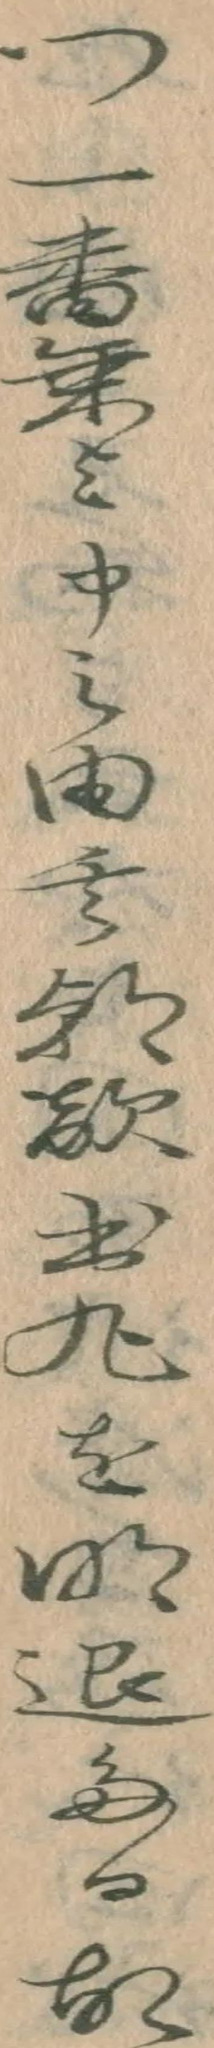門一番乗与申之由其朝敵出丸を明退多る故
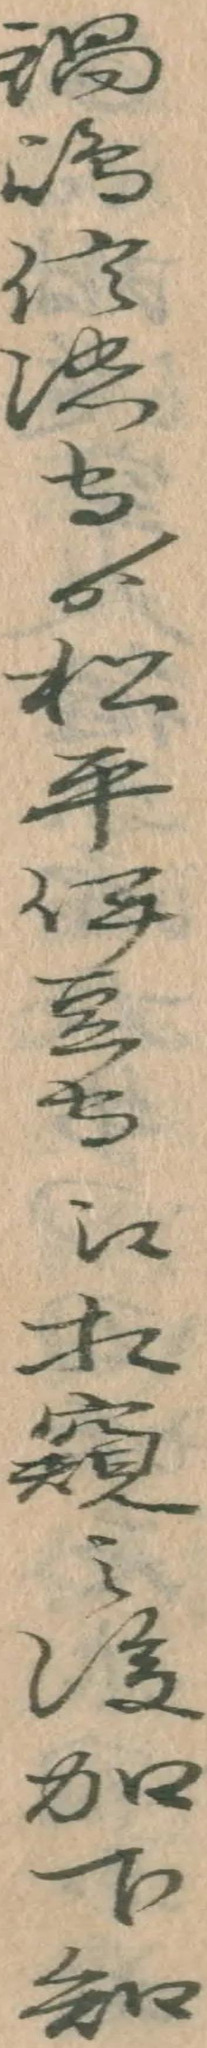鍋島信濃守ゟ松平伊豆守江相窺之後加下知
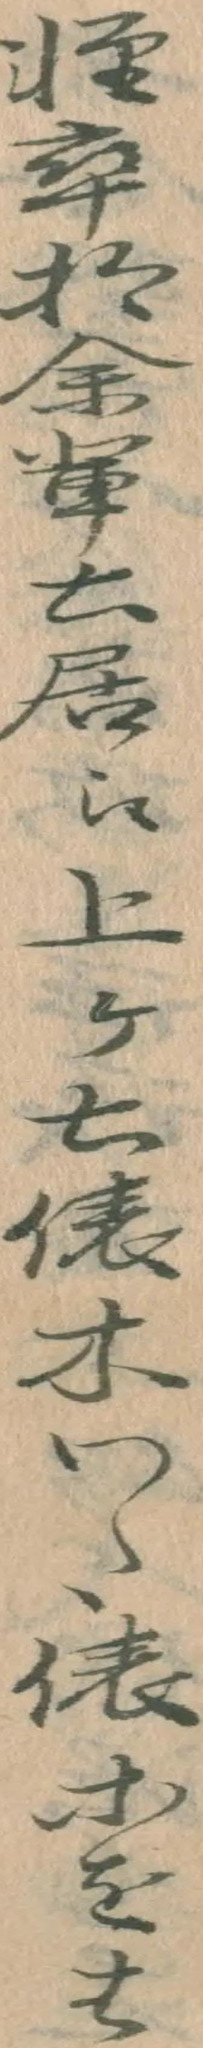軽卒於余輩土居江上け土俵木わた俵等を者
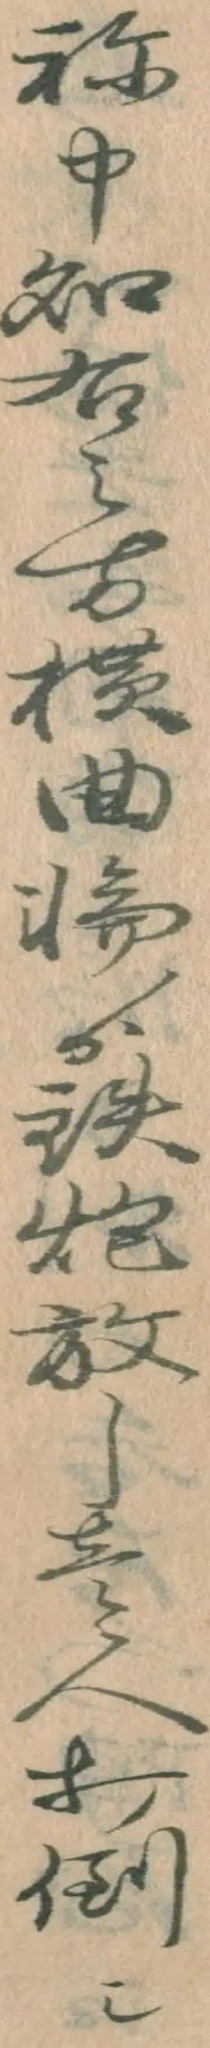祢申処右之方横曲輪ゟ鉄砲放し壱人打倒し
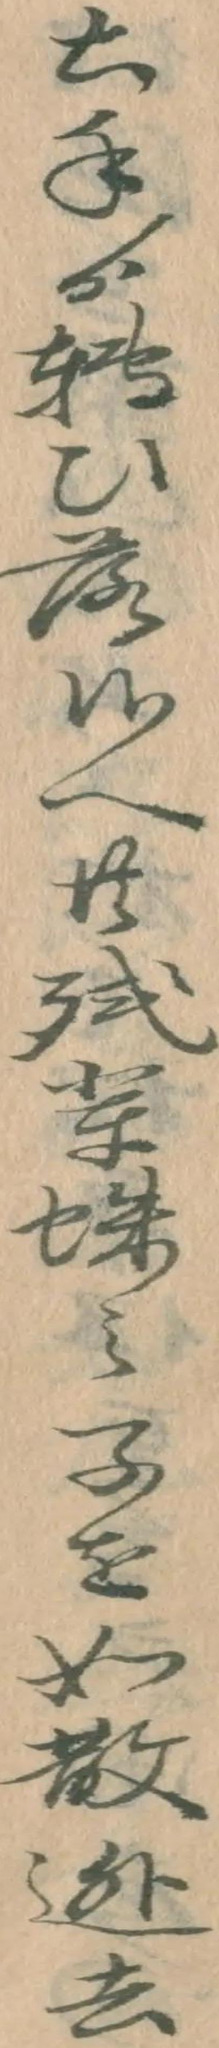土手ゟ転ひ落候へ共残輩蛛之子を如散逃去

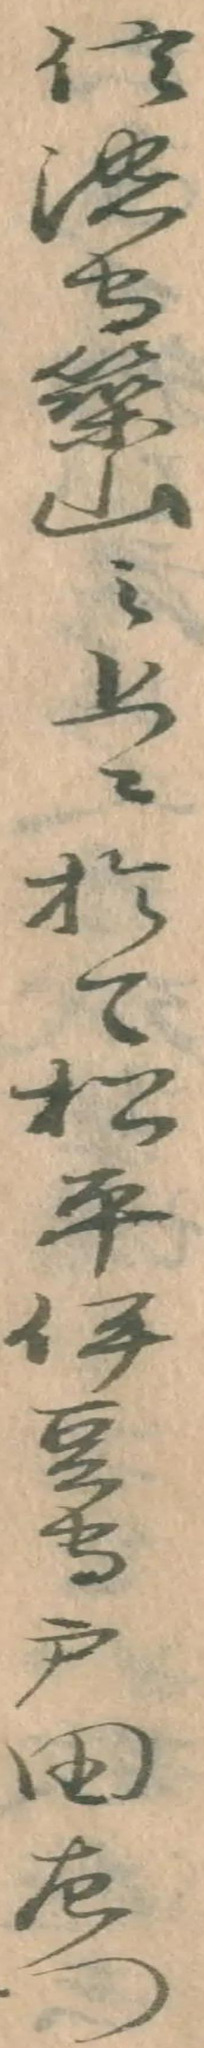信濃守築山之上に於て松平伊豆守戸田左門
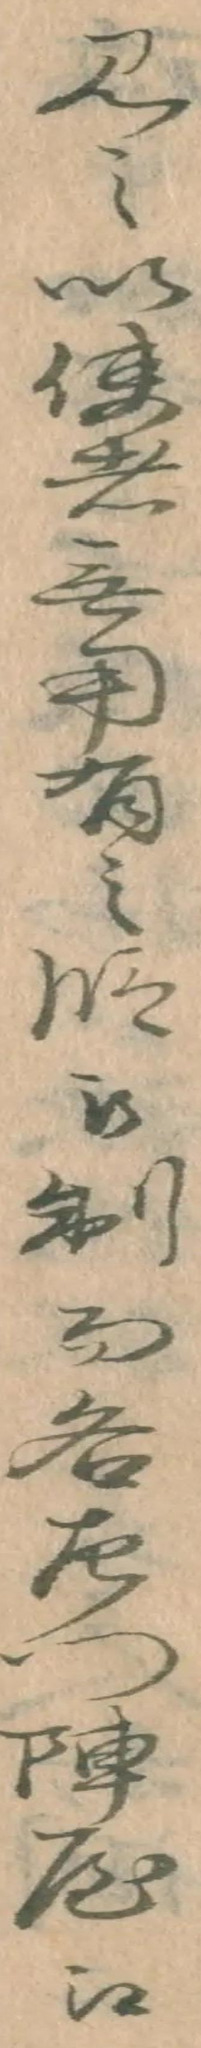見之以使者無用有之段被制而各左門陣屋江
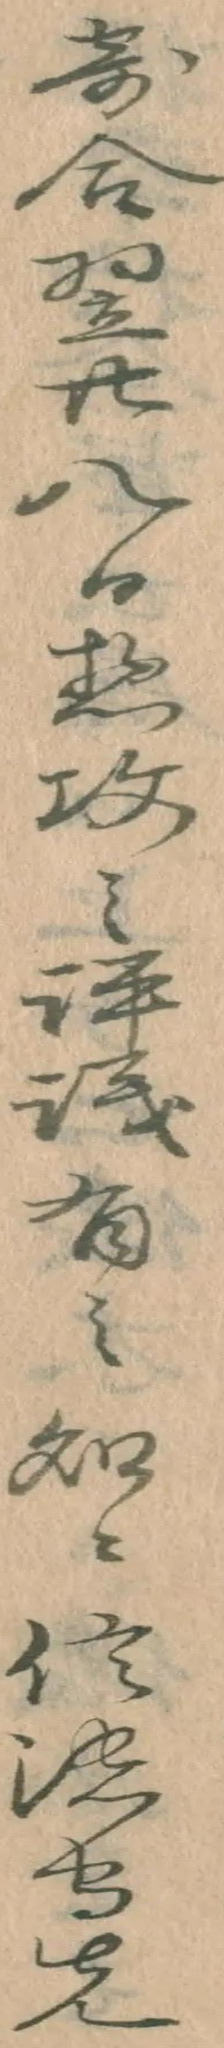寄合翌廿八日惣攻之評議有之処に信濃守先
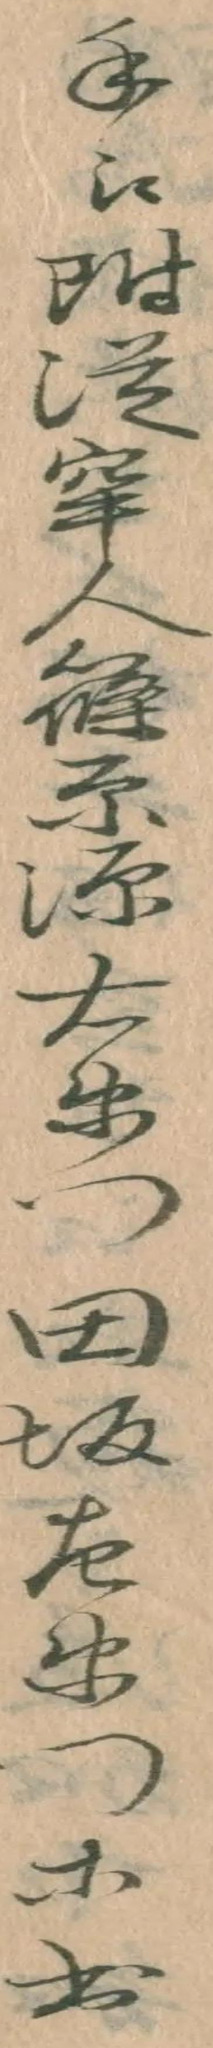手江就従牢人篠原源右衛門田坂左衛門等出
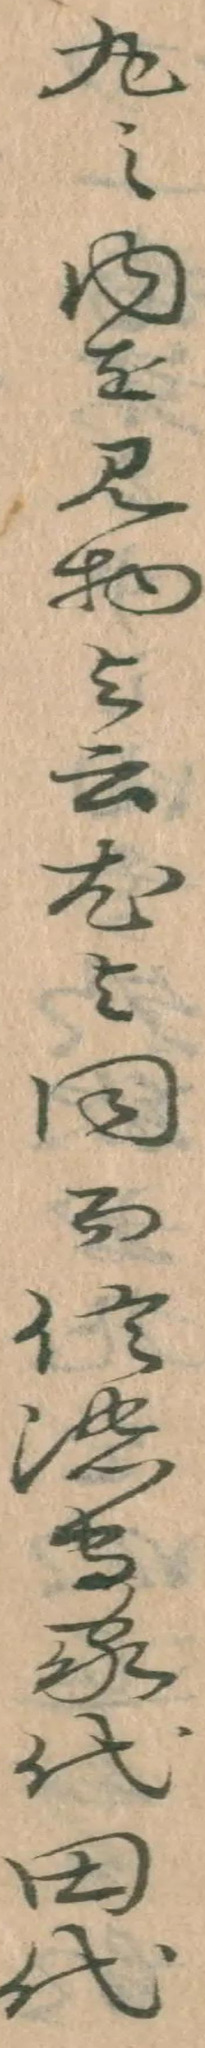丸之内を見物与云尤与同而信濃守家代田代
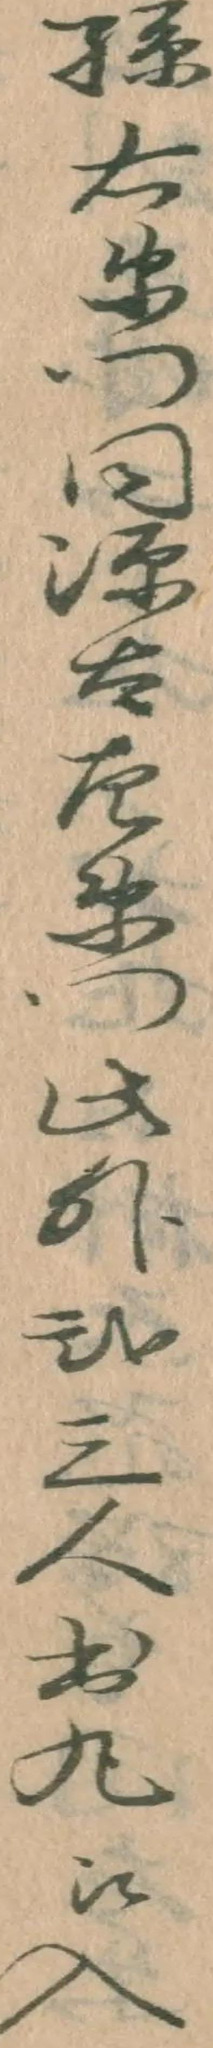孫右衛門同源太左衛門此外弐三人出丸江入
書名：切支丹御退治記 49巻. [8]
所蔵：国立国会図書館 National Diet Library, JAPAN
